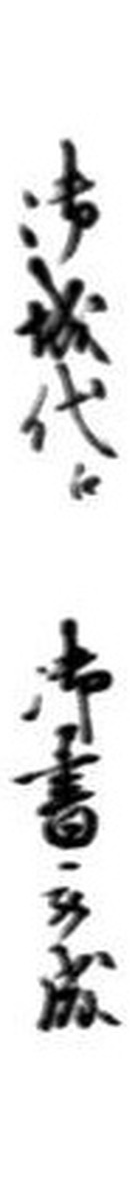御城代江御書被成
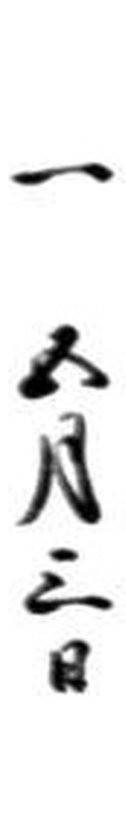一五月三日
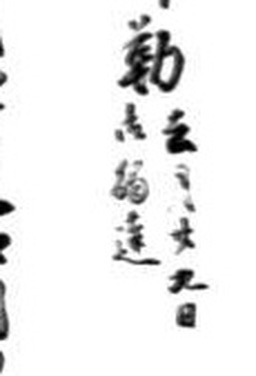御触達
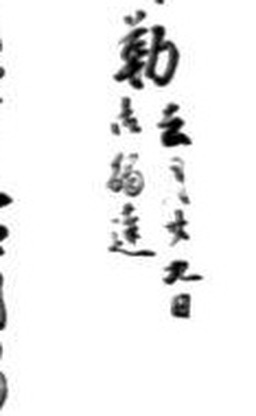御触達
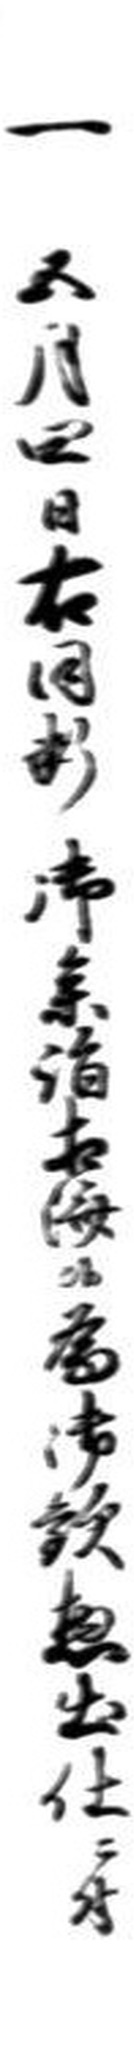一五月四日右同断御参詣相済候為御歓惣出仕ニ付
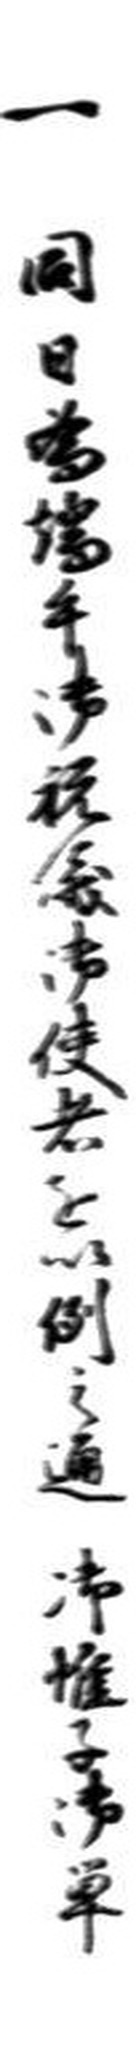一同日為端午御祝儀御使者を以例之通御帷子御単

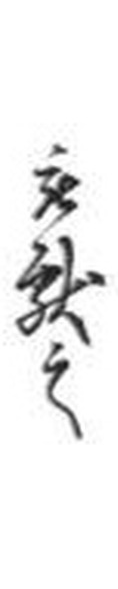被献之
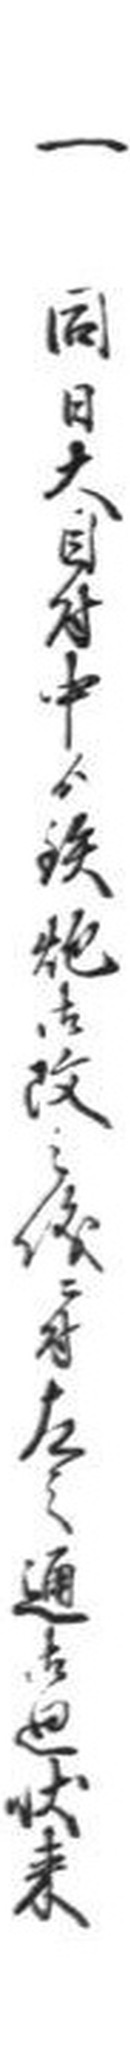一同日大目付中ゟ鉄炮御改之儀ニ付左之通御廻状来
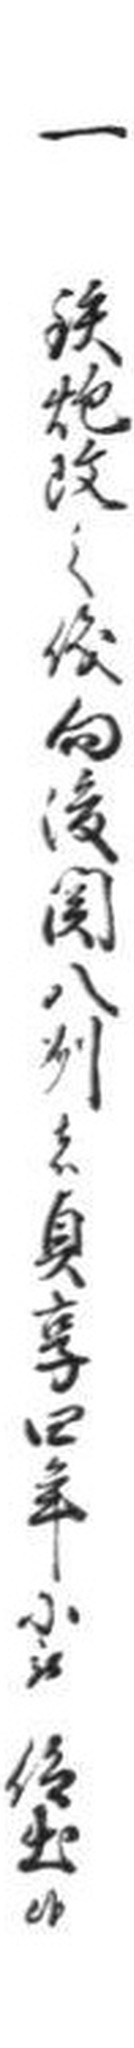一鉄炮改之儀向後関八州者貞享四年に被仰出候
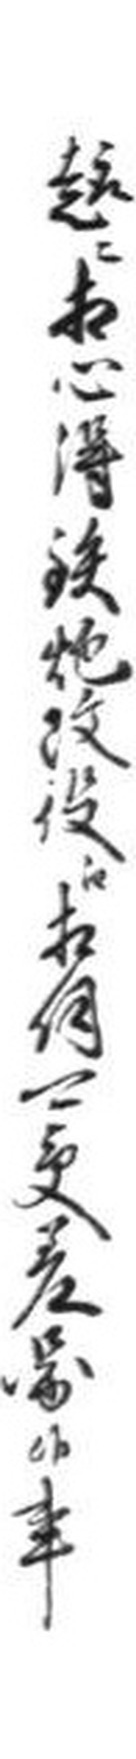趣ニ相心得鉄炮改役江相伺可受差図候事
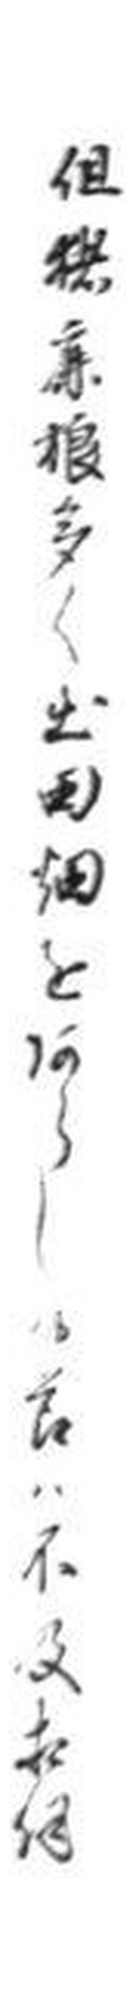但猪鹿狼多く出田畑をあらし候節ハ不及相伺
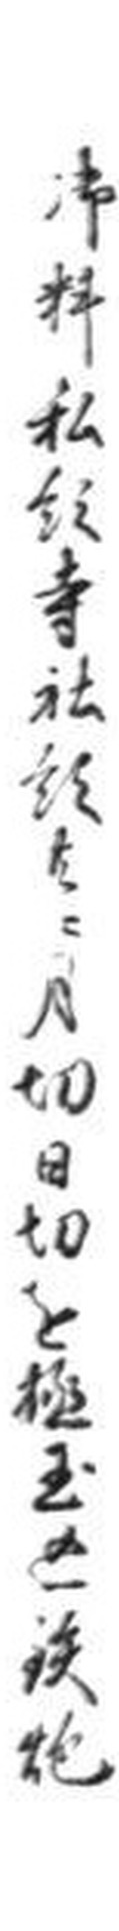御料私領寺社領共ニ月切日切を極玉込鉄炮
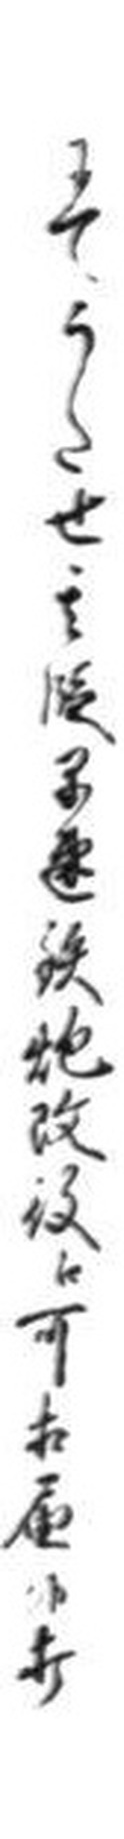にてうたせ其段早速鉄炮改役江可相届候打
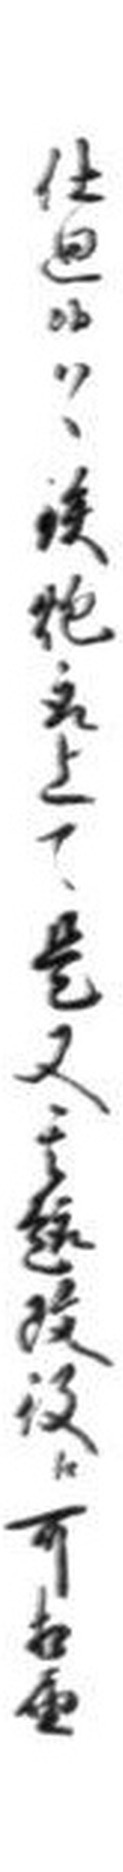仕廻候ハヽ鉄炮取上て是又其趣改役江可相届
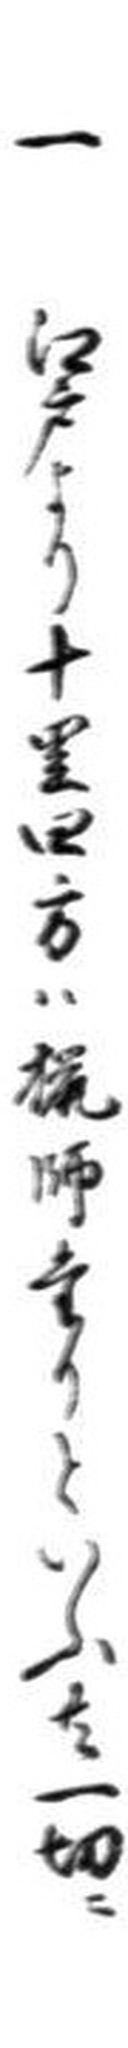一江戸より十里四方ハ猟師たりといふ共一切ニ
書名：家譜 三十二 吉邦公 従享保二年到享保三年
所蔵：福井県文書館 Fukui Prefectural Archives
